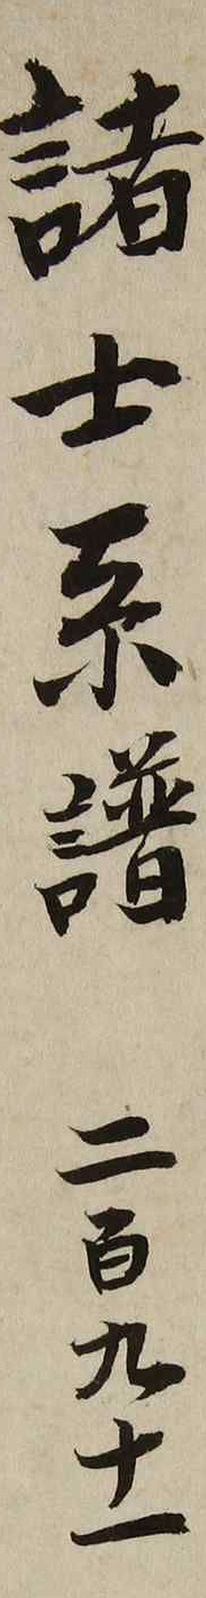諸士系譜二百九十一

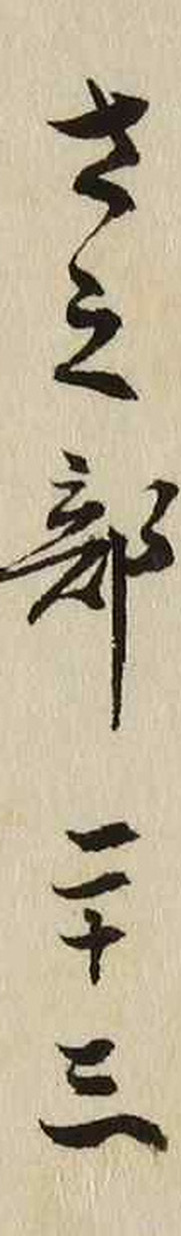さ之部二十三
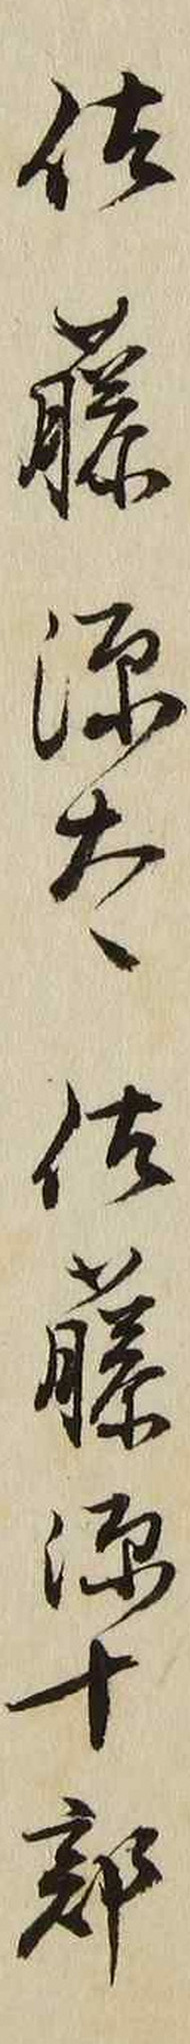佐藤源太佐藤源十郎
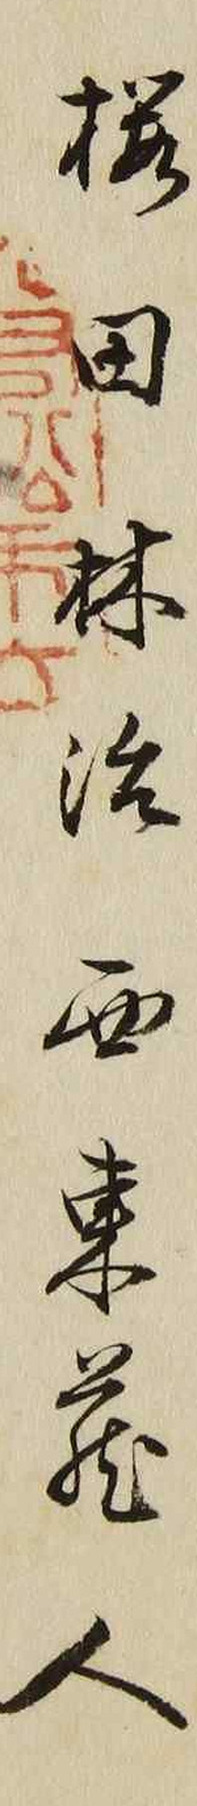桜田林治西東蔵人

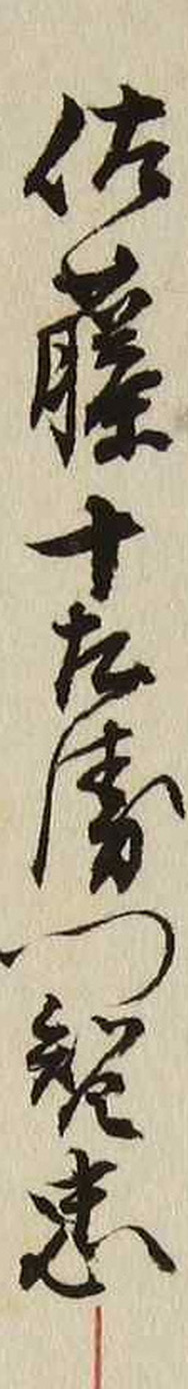佐藤十左衛門智忠
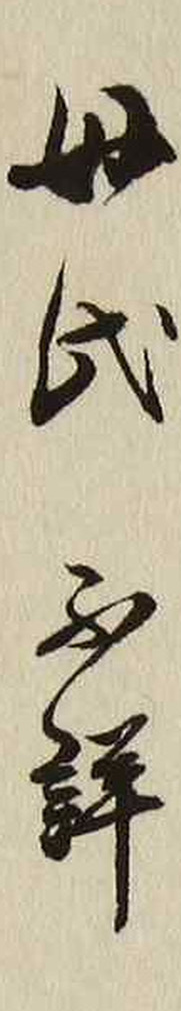母氏不詳
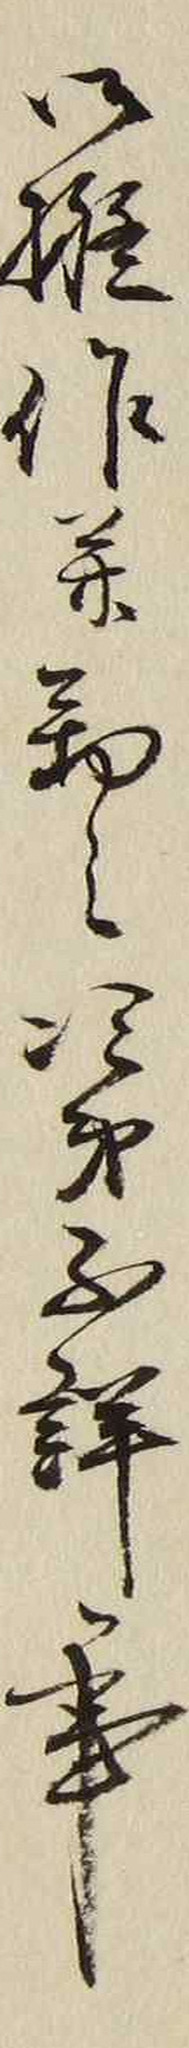御擬作并勤之次第不詳候事
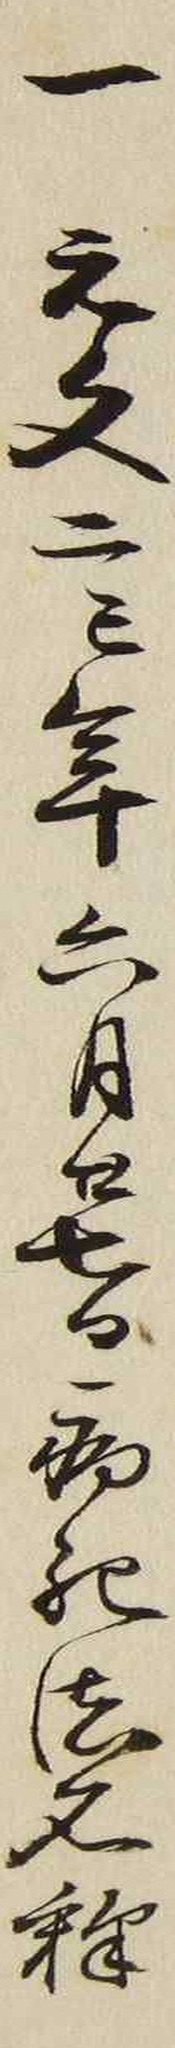一元文二巳年六月廿七日病死法名釈

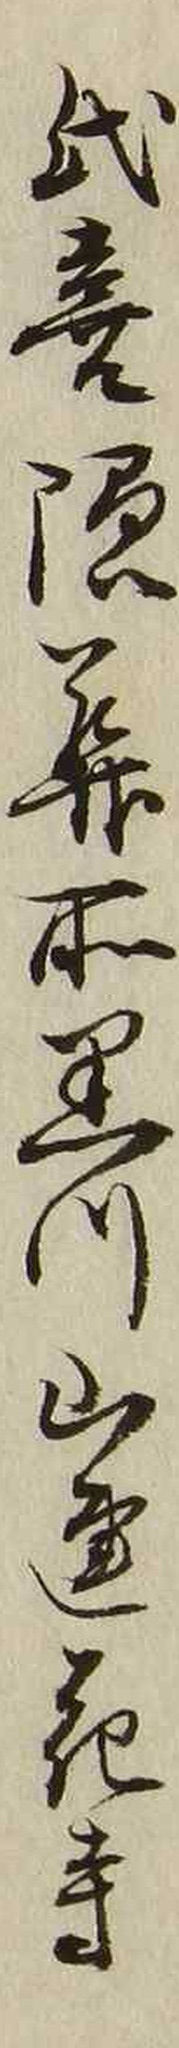氏喜隠葬所黒川山連花寺
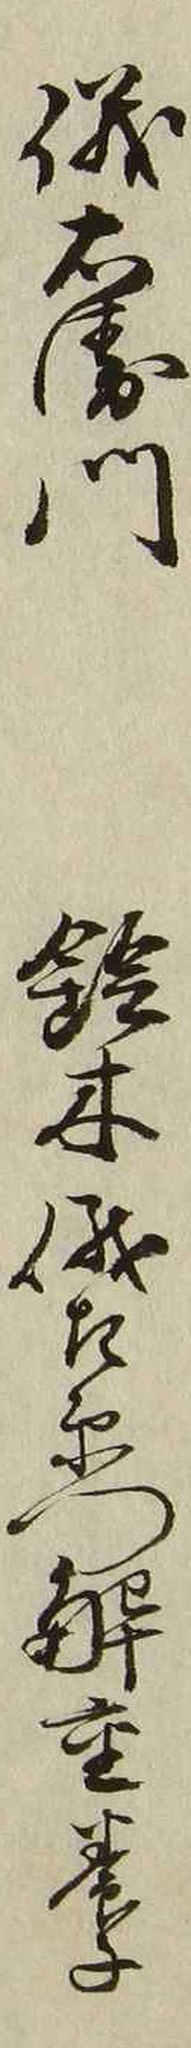儀右衛門鈴木儀左衛門解重養子
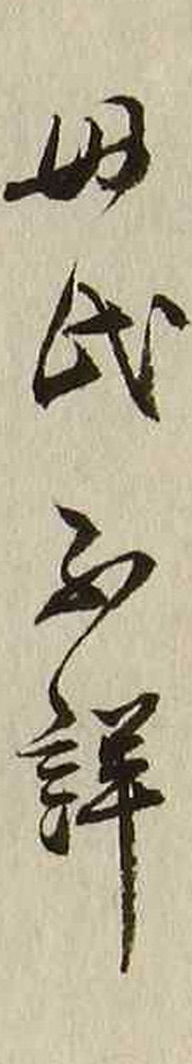母氏不詳
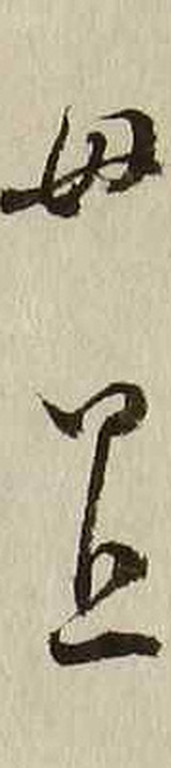母同上
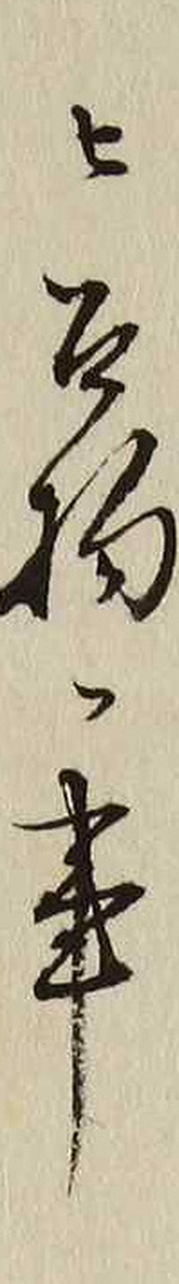被召抱候事
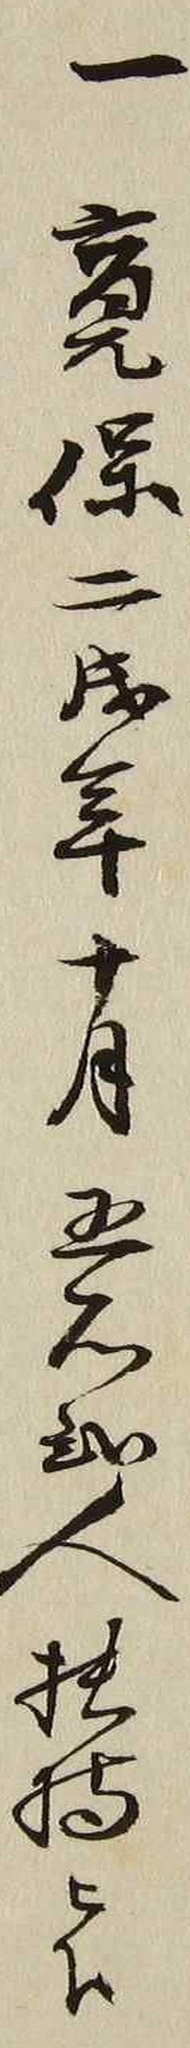一寛保二戌年十月五石弐人扶持被下
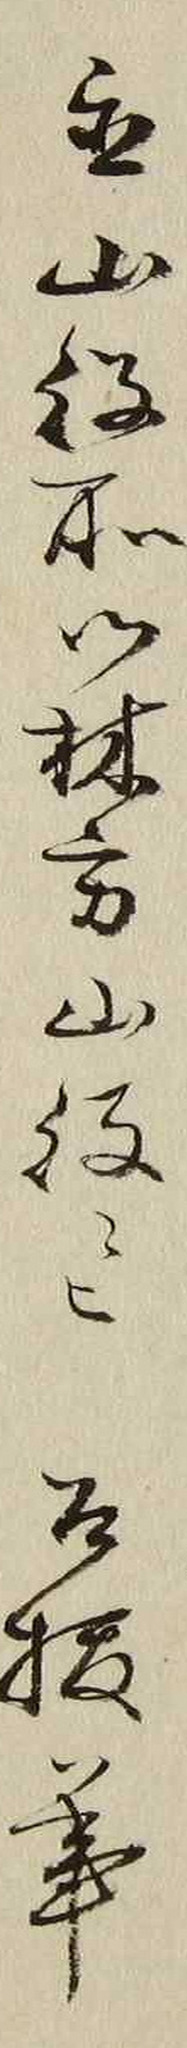置山役所御林方山役ニ被召抱候事
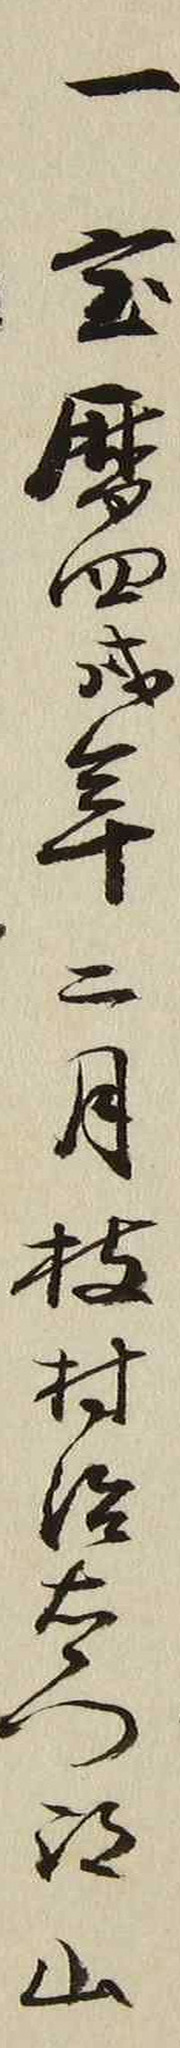一宝暦四戌年二月枝村治右衛門跡山
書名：諸士系譜　巻之291　さ之部23
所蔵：会津若松市立会津図書館
